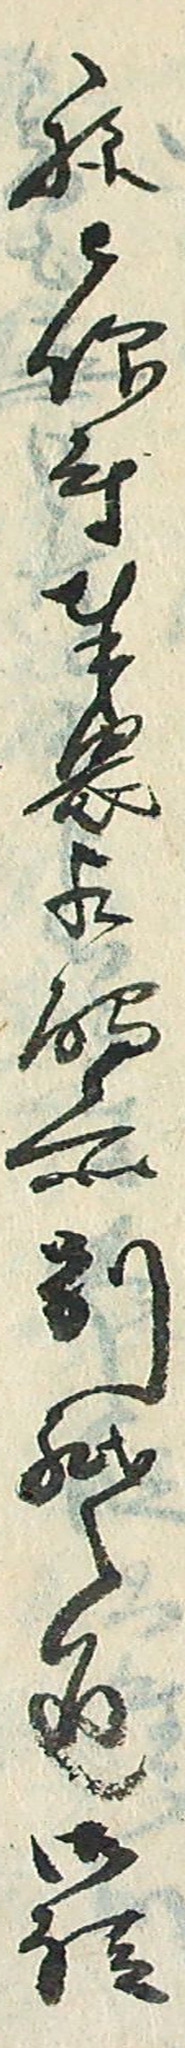候様被仰付奉畏相触候所別紙之通御請
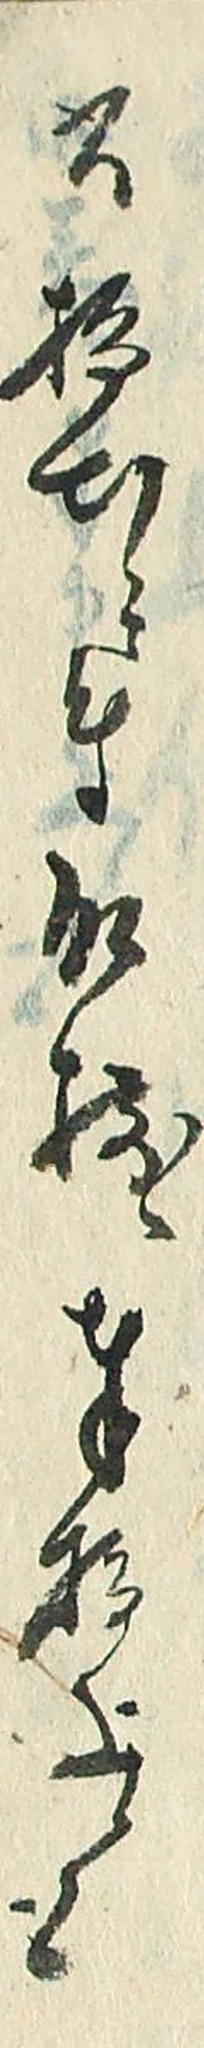書指出候に付取揃へ奉指上候以上

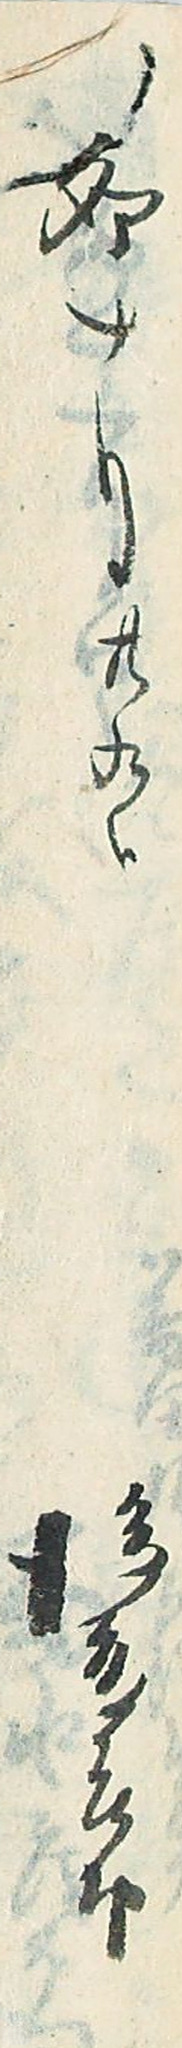卯十月廿九日後藤庄助
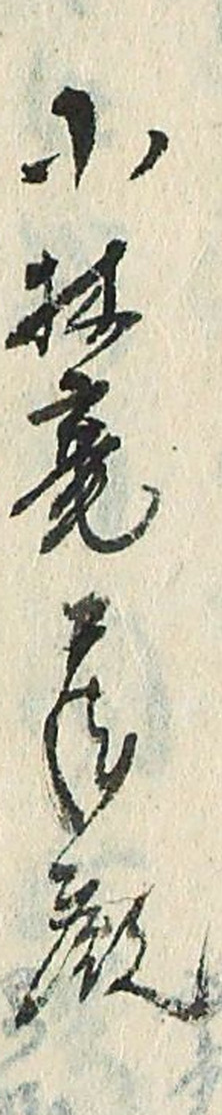小林竜蔵殿
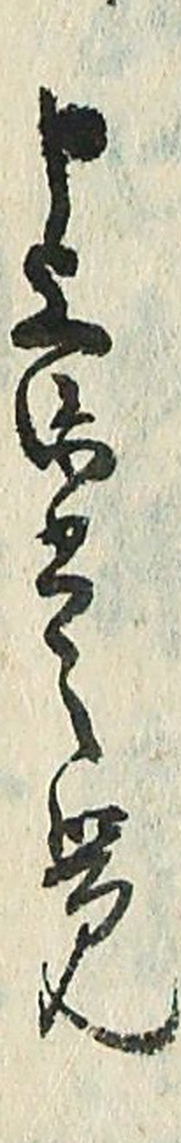申上添書之覚
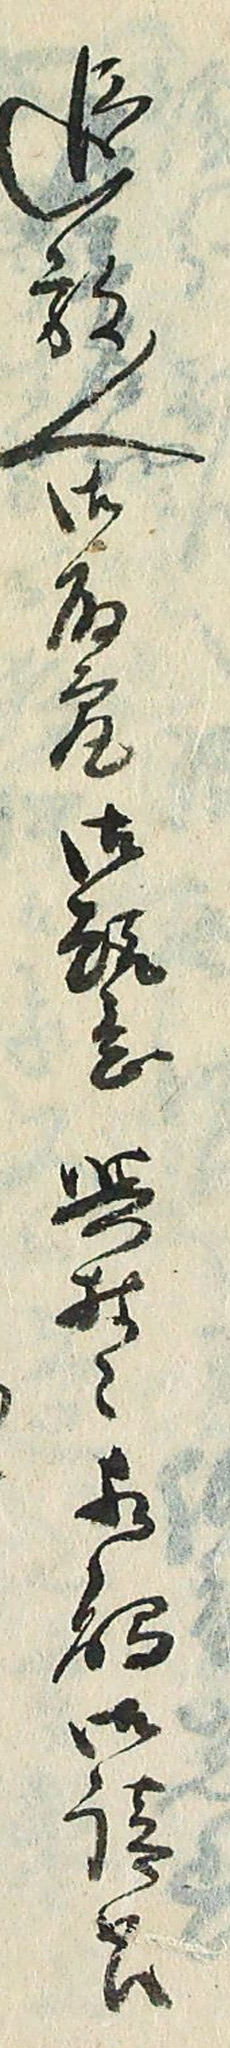追放人御取究御趣意与村々相触御請書
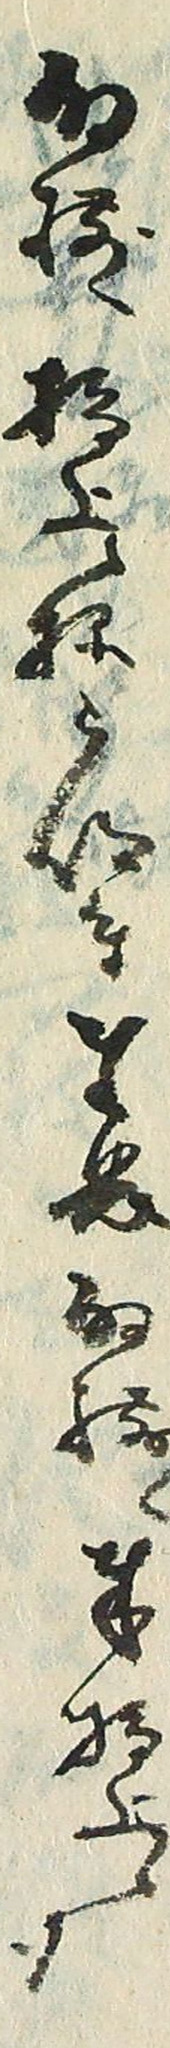取揃指上候様被仰付奉畏取揃へ奉指上候以上
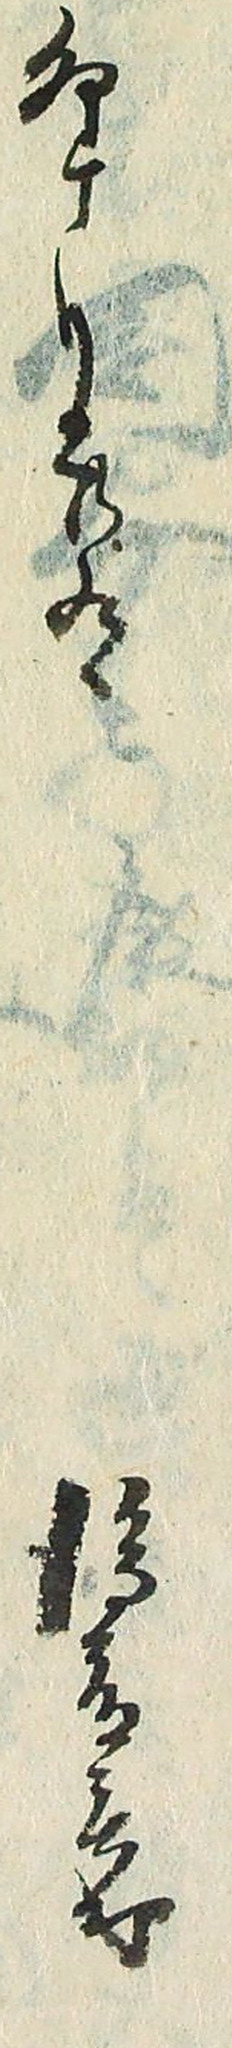卯十月廿九日後藤庄助
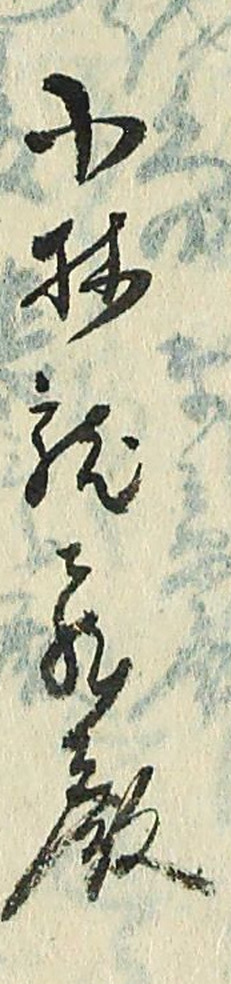小林龍蔵殿
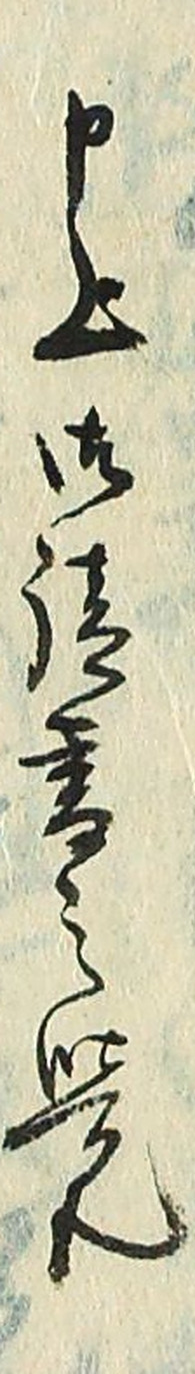申上御請書之覚
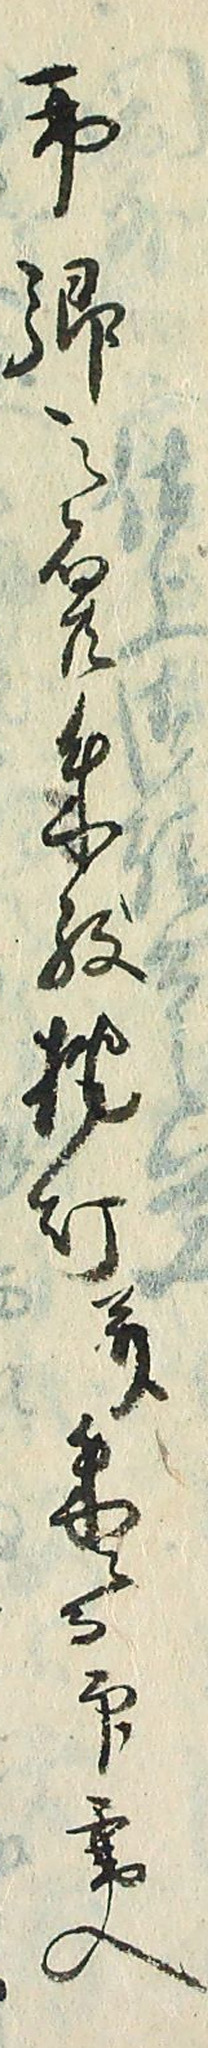一市郷之者共朱紋挑灯幷朱にて印書入
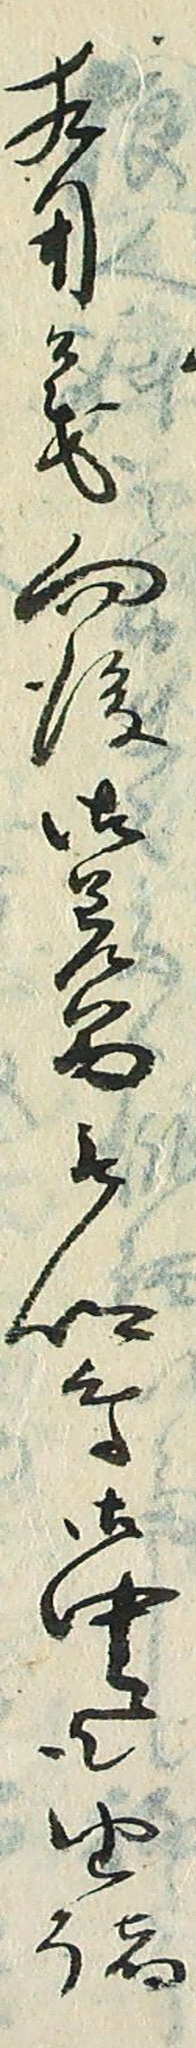相用候義向後御差留被仰付御中にも由緒
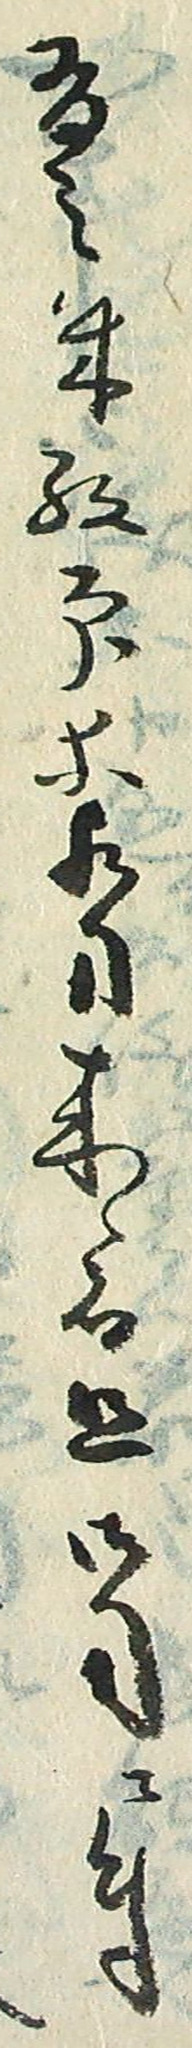有之朱紋印等相用来候者且御用に付
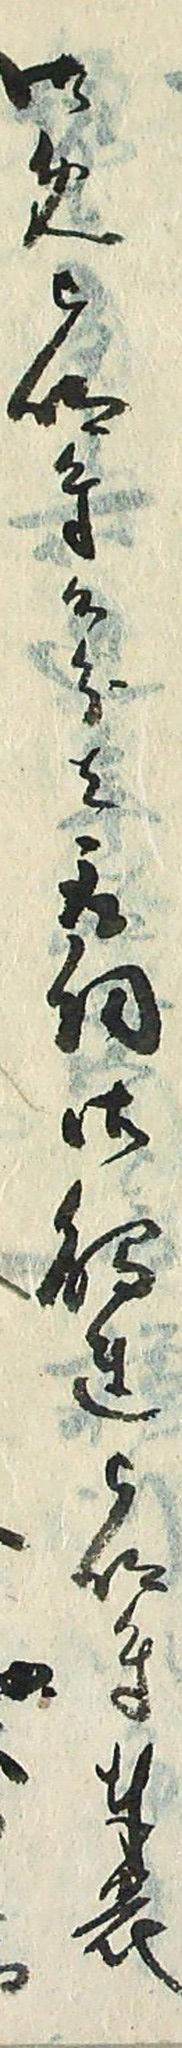御免被仰付候分は取調御触達被仰付奉畏
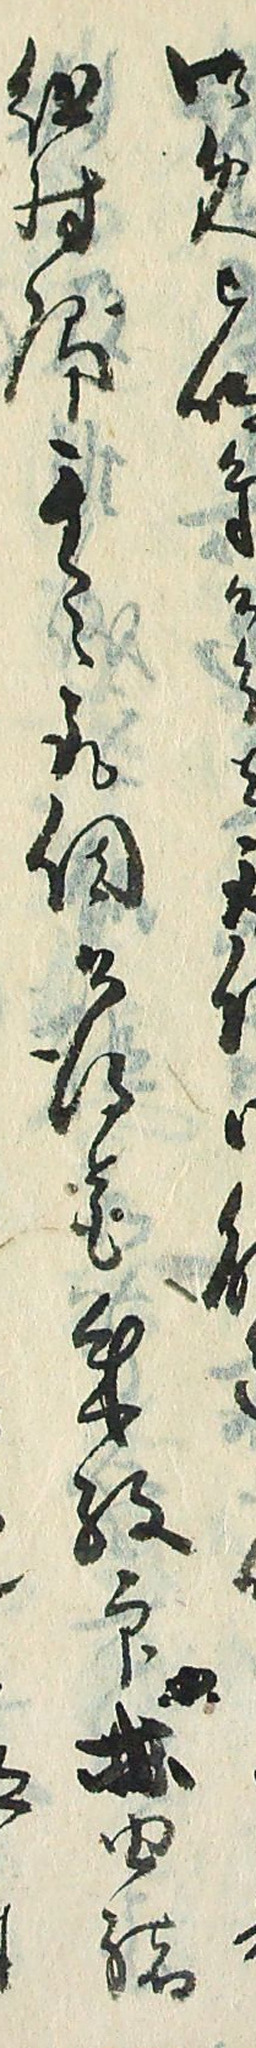組村浦重々取調候得とも朱紋印等由緒
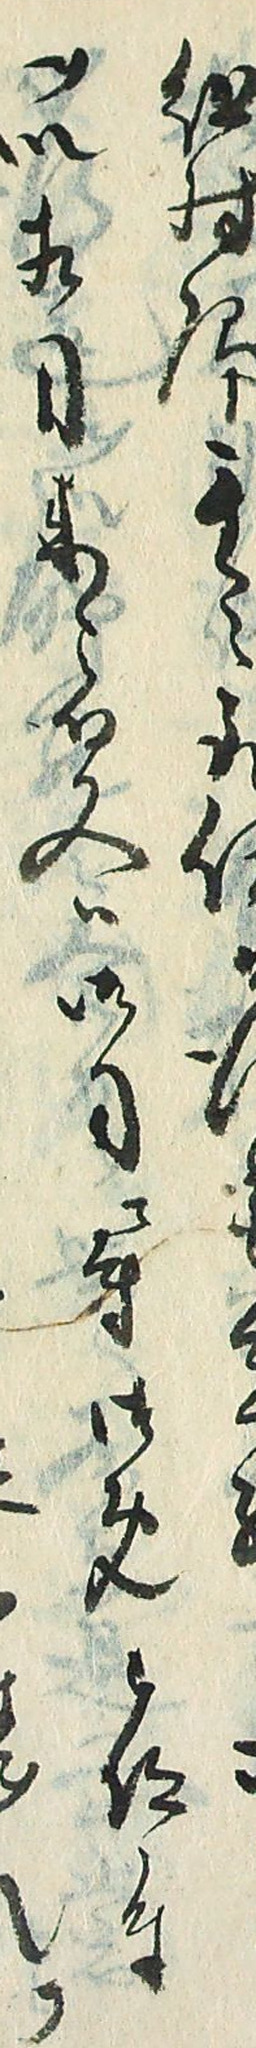を以相用来候者又は御用に付御免被仰付
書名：諸御用御□受書控
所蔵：鳴門教育大学 Naruto University of Education
